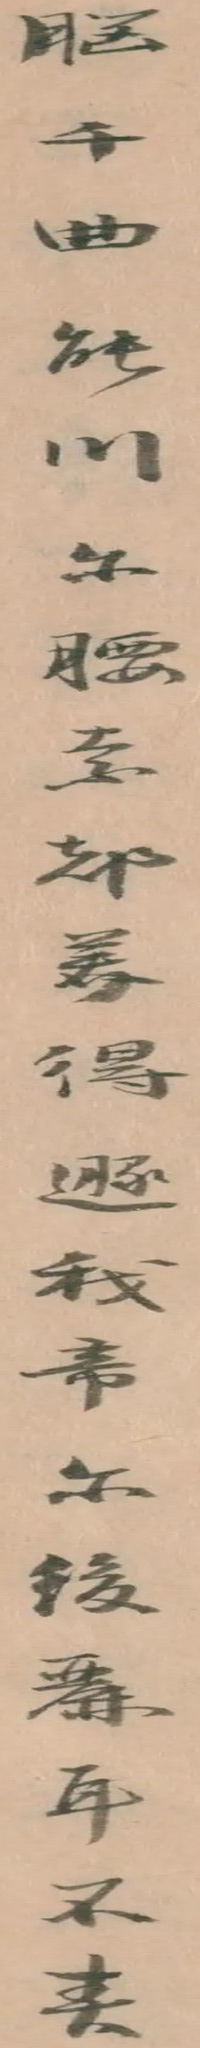脳千曲能川尓腰奈都美得遯我帝尓後麗耳不春
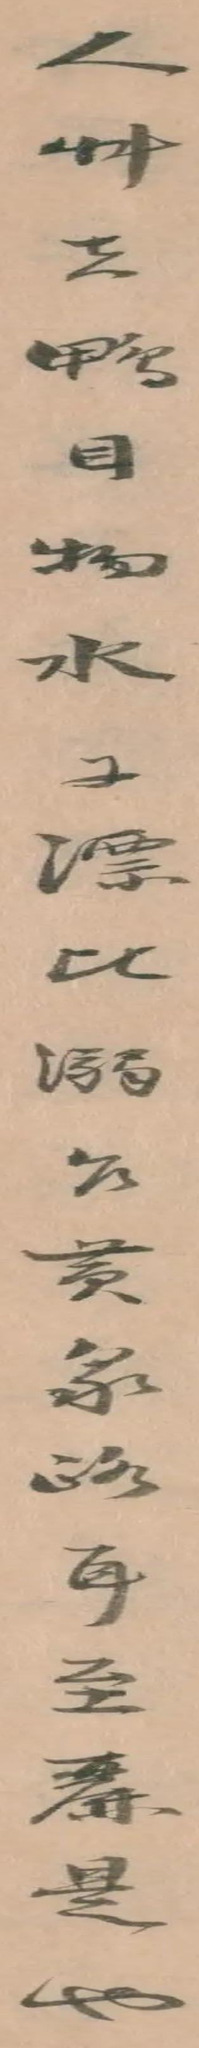人艸者鴨目物水尓漂比溺乍黄家路耳至麗是や
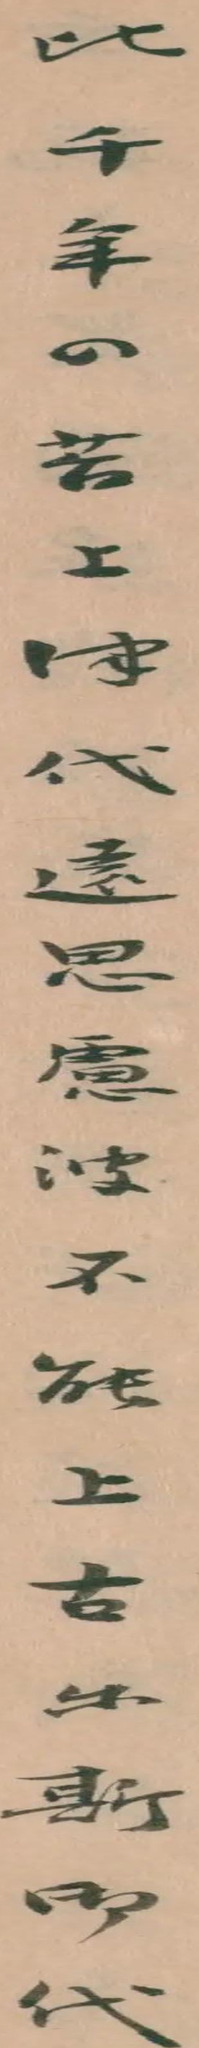比千年の苔上津代遠思慮波不能上古尓斯御代
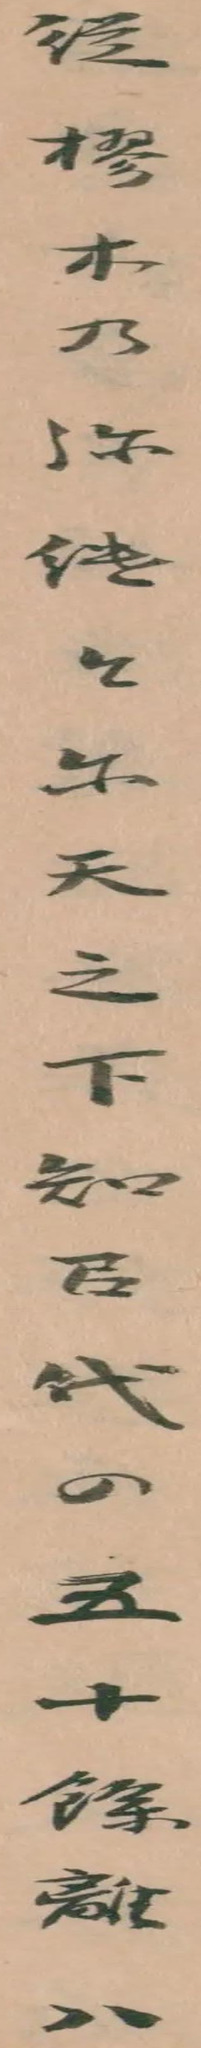従樛木乃弥継今尓天之下知召代の五十余離八
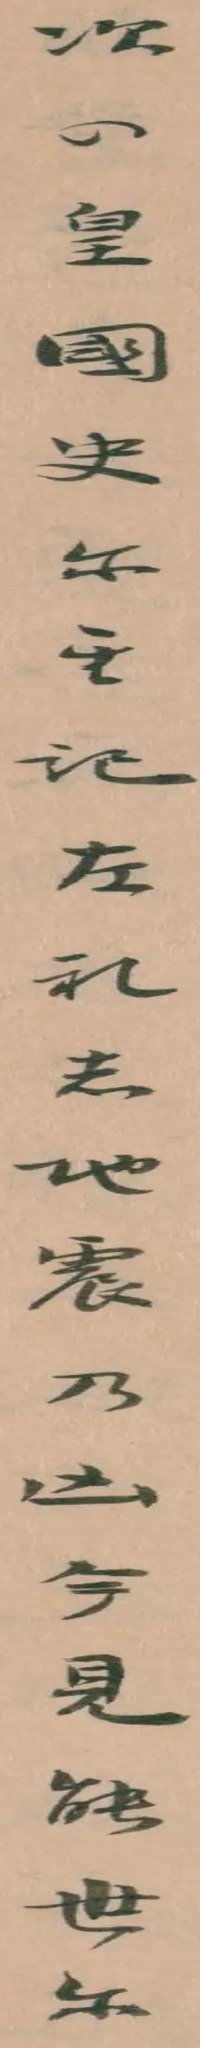次の皇国史尓其記左礼志地震乃凶今見能世尓
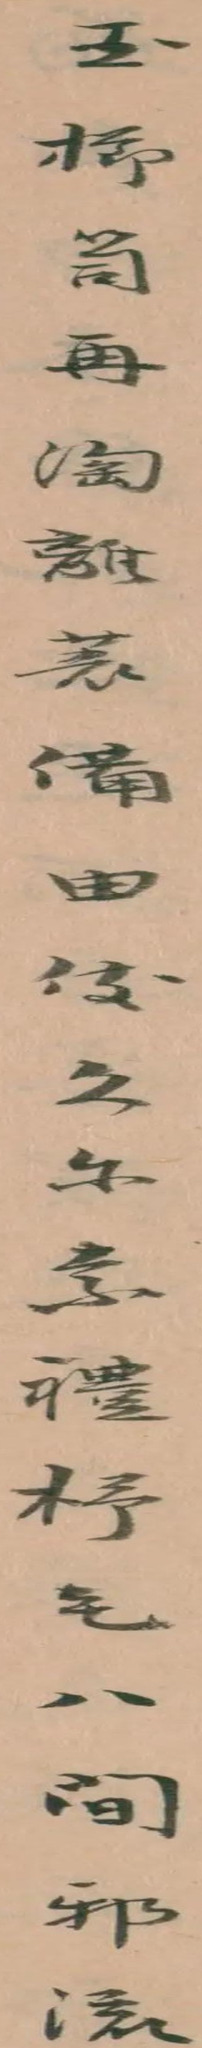玉櫛笥再淘離備由技久尓奈禮杼毛八間邪流
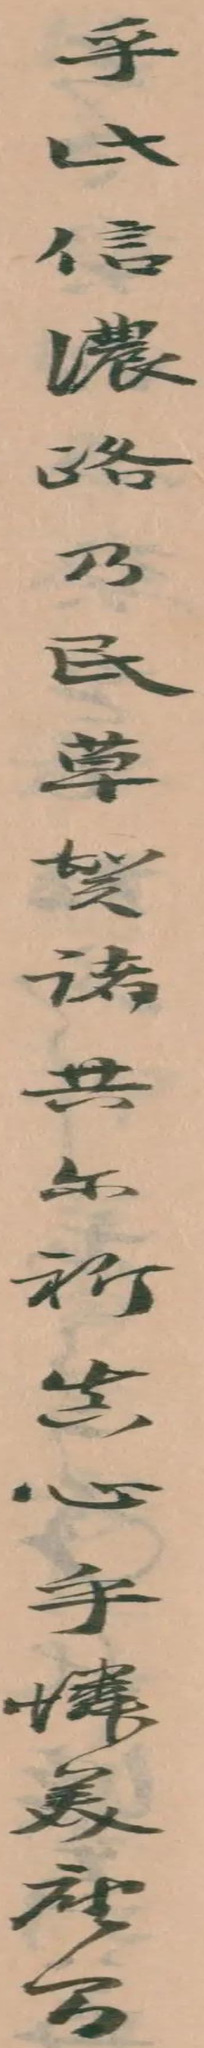乎此信濃路乃民草賀諸共尓祈真心乎憐美座間
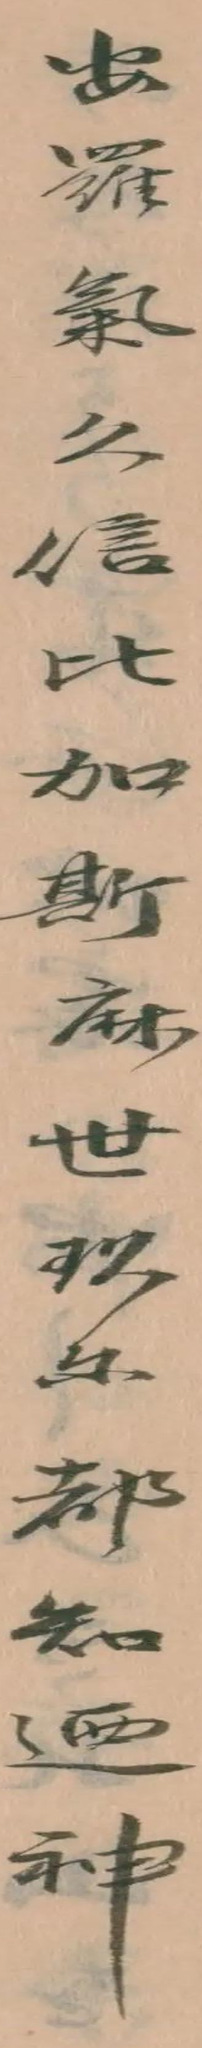安羅気久信比加斯麻世玖尓都知迺神
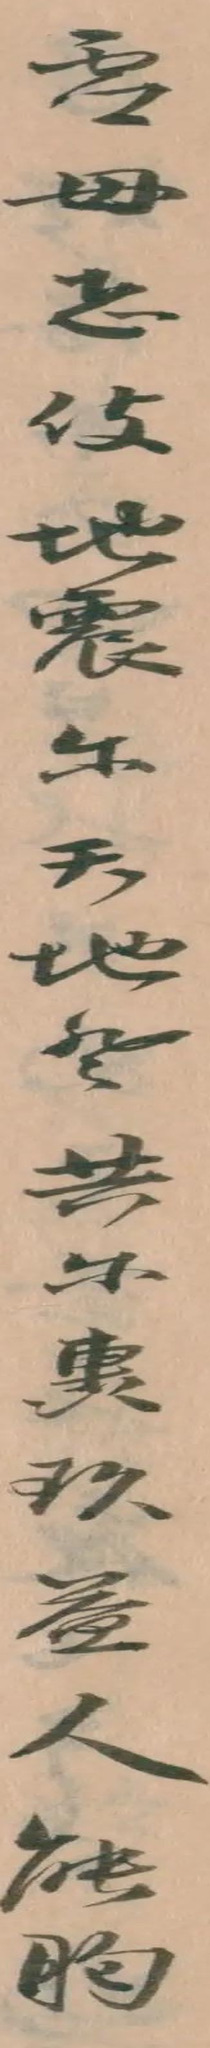雪母恐技地震尓天地登共尓轟玖益人能胸
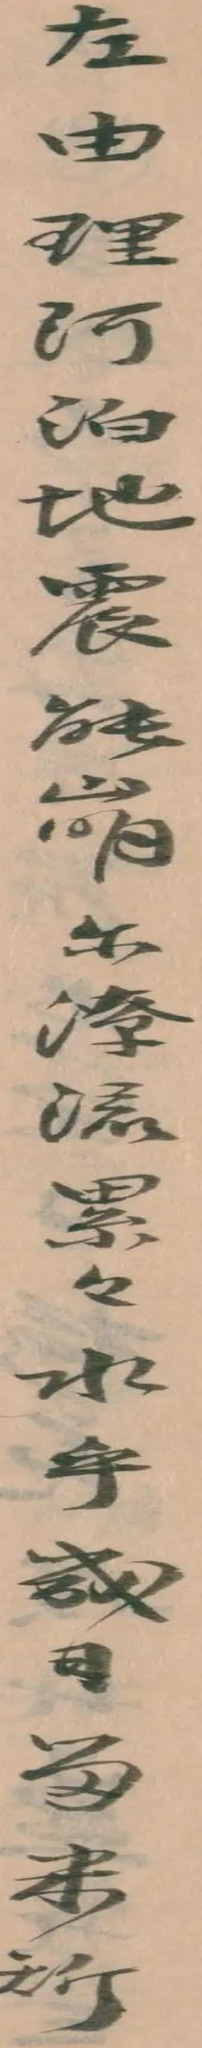左由理河泊地震能崩尓潦流累々水乎咸日留米斯
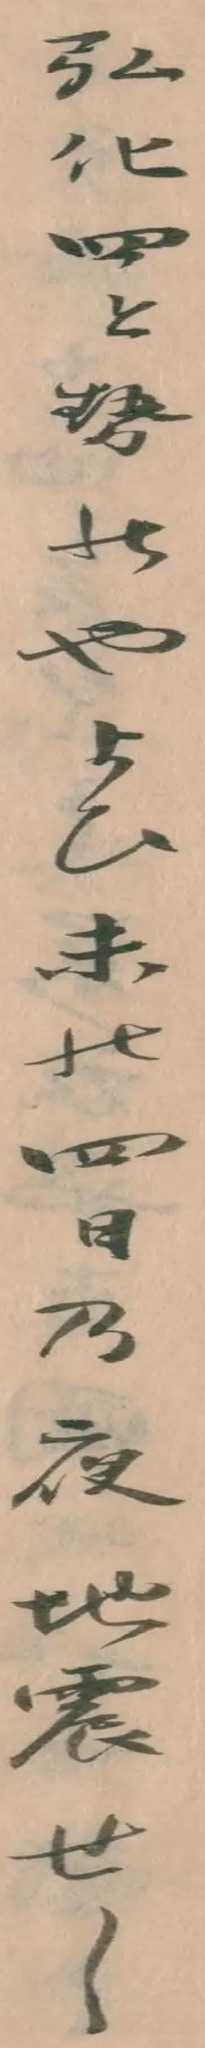弘化四とせのやよひ未の四日の夜地震せし
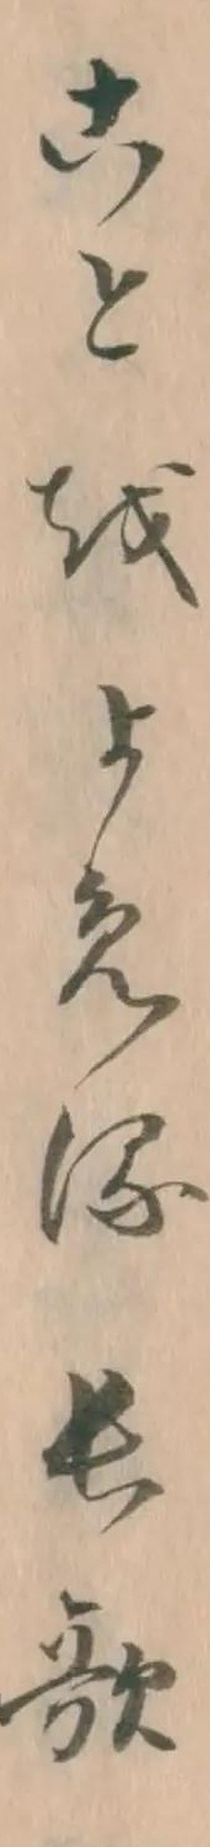ことをよめる長歌
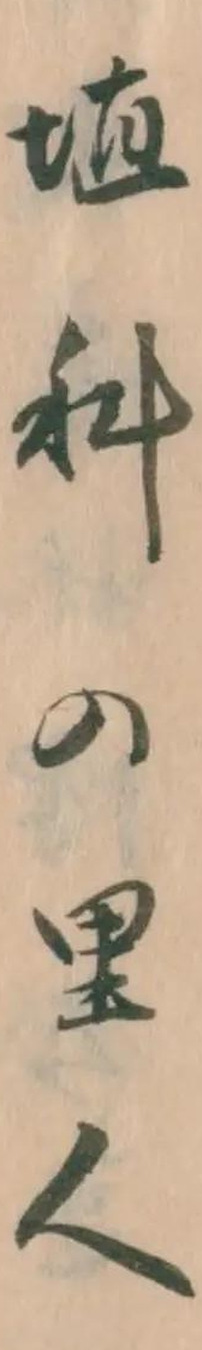埴科の里人

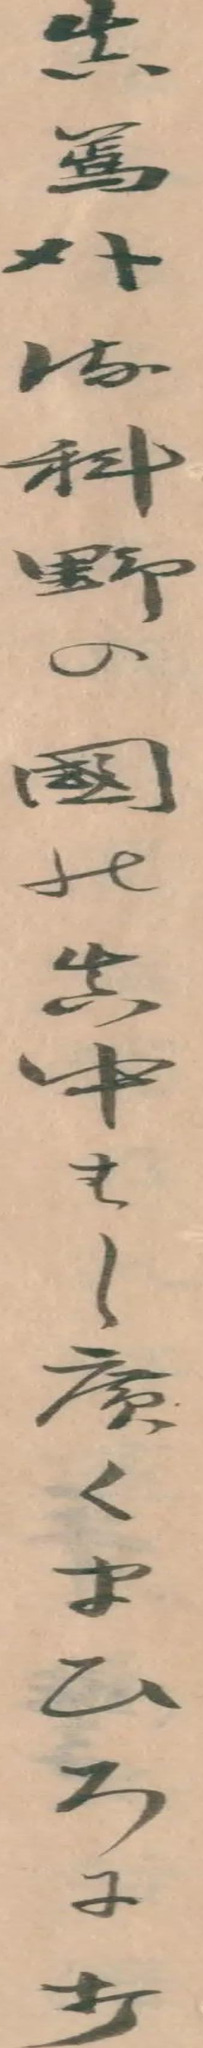真薦刈る科野の国の真中はし広くまひろに打
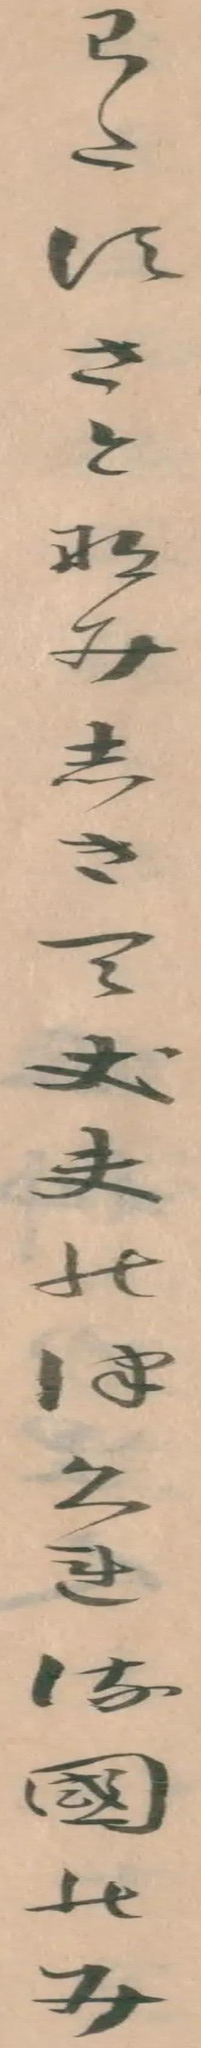わたすさとなみしきて丈夫のつくれる国のみ
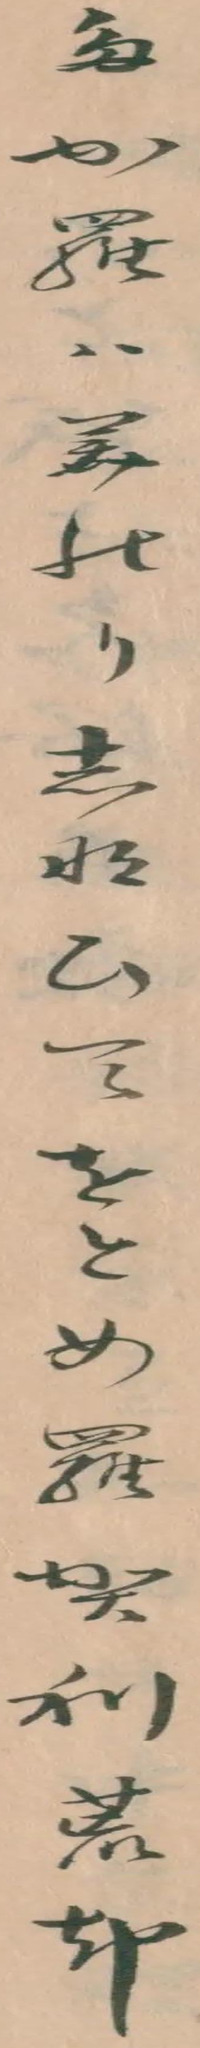たからはみのりしなひてをとめらかり荒都
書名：地災撮要. 巻5-6(地震之部)
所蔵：国立国会図書館 National Diet Library, JAPAN
